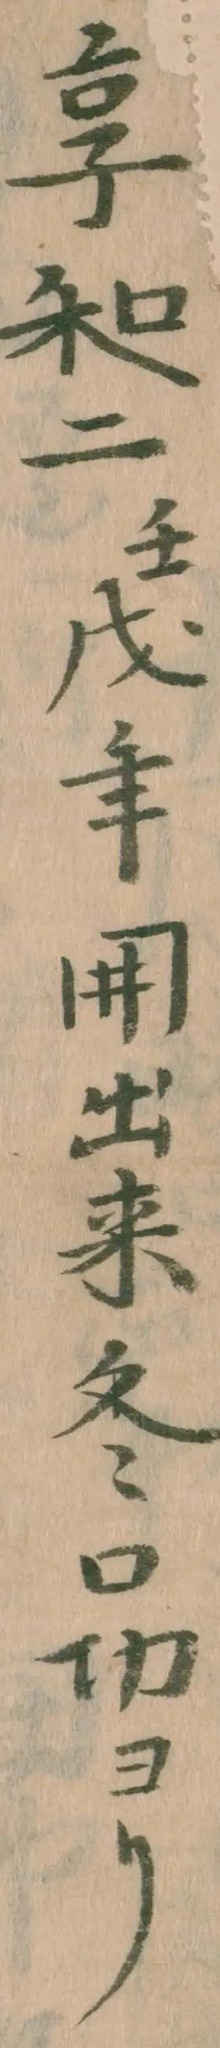享和二壬戌年囲出来冬口切ヨリ
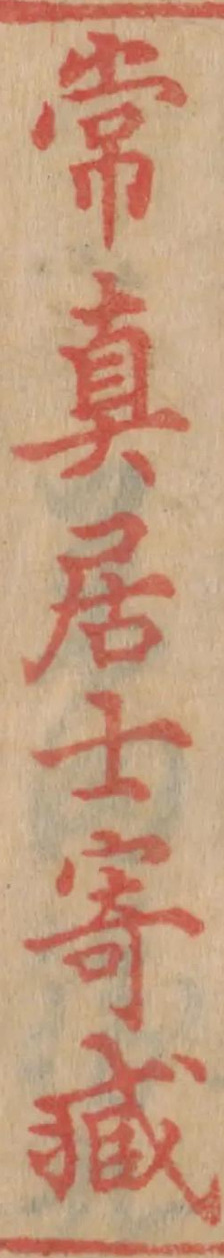常真居士寄蔵
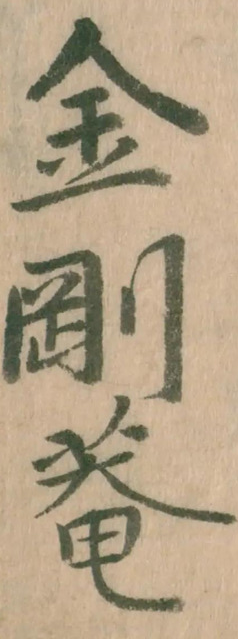金剛庵

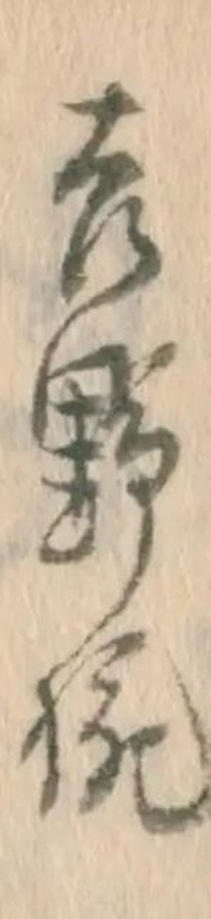吉野椀
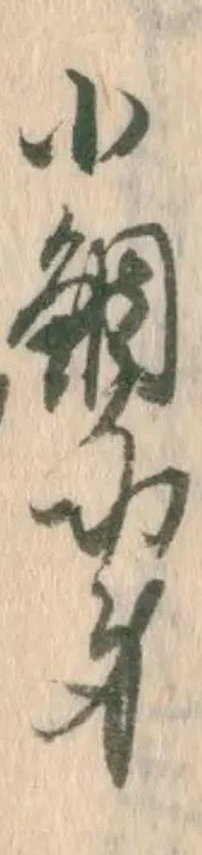小鯛切身
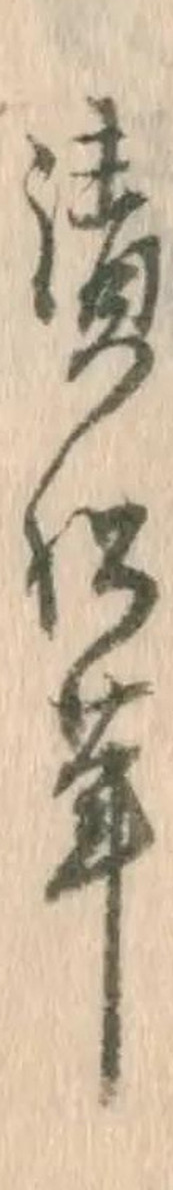漬松茸
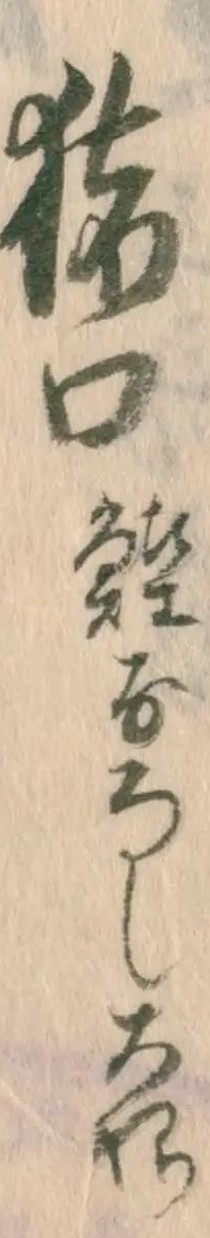猪口鮭おろし大根
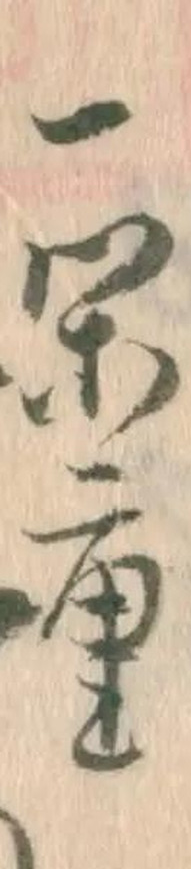一品重
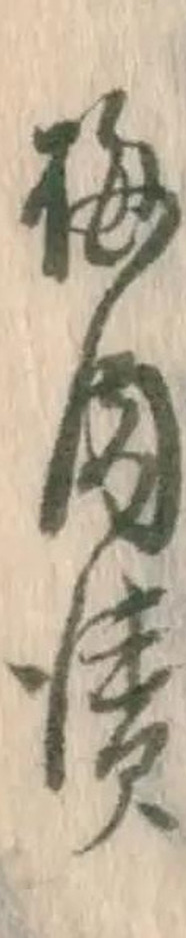梅肉漬
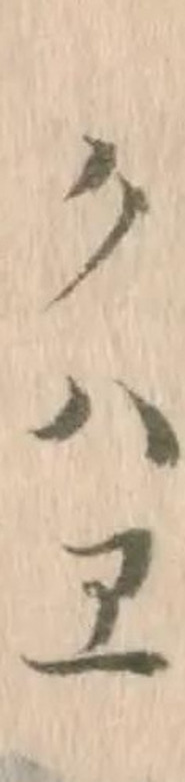クハヱ
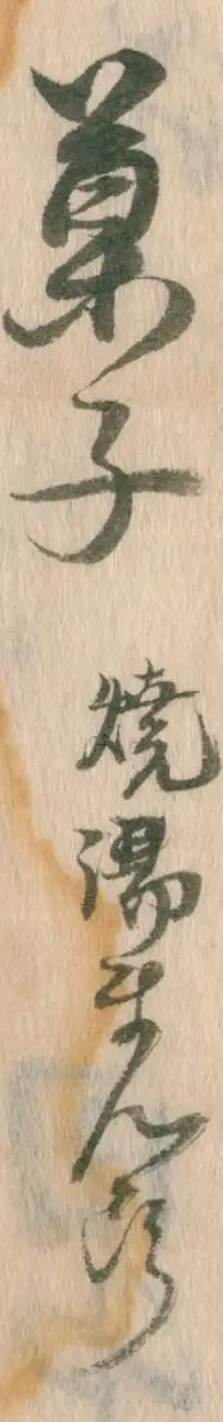菓子焼湯まん
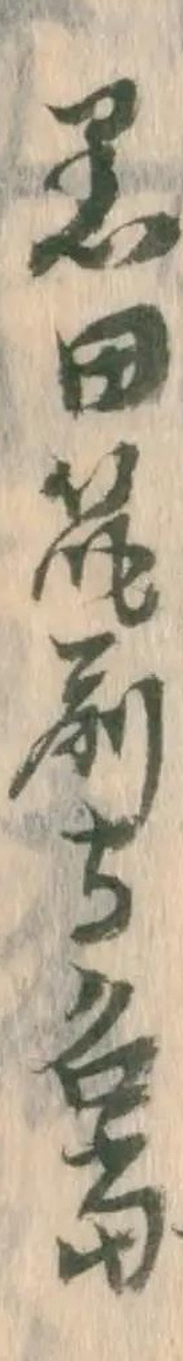黒田筑前守名
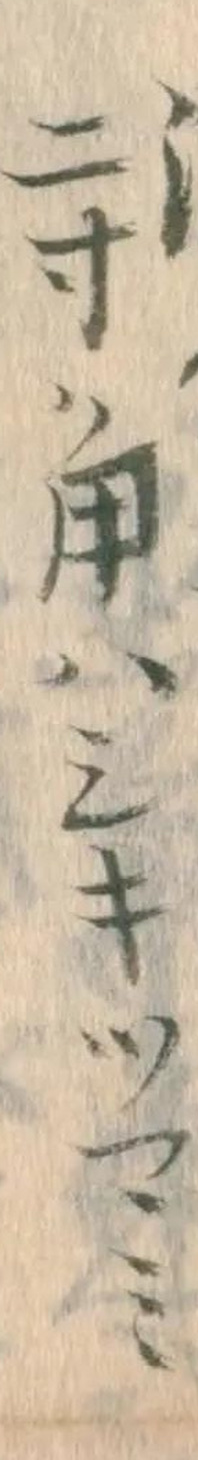二寸角用ハシキツマミ
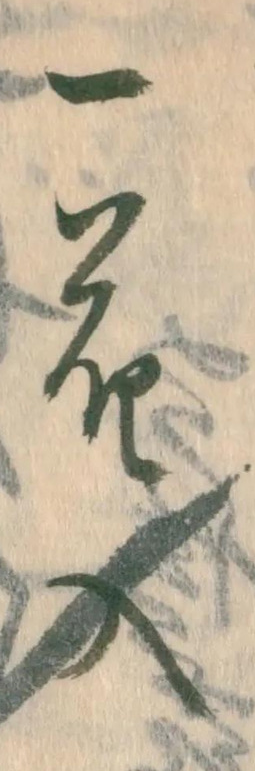一花入
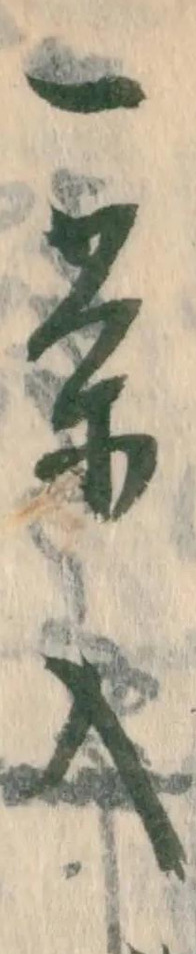一花入
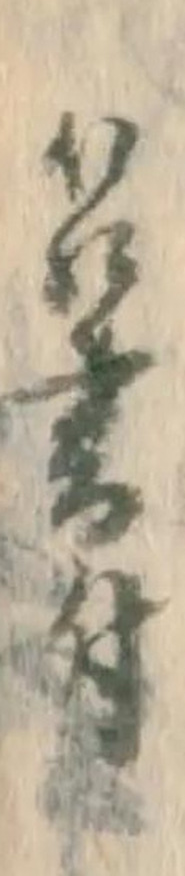名書付
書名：妙喜庵茶事道具料理扣
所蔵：国立国会図書館 National Diet Library, JAPAN
